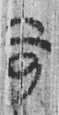可
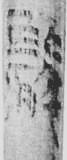{手彔}（握）
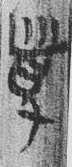○（一）
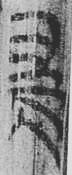耑（端）
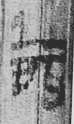○（聞）
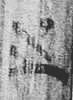之
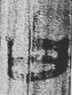曰
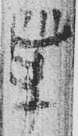○（一）
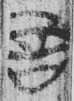言
